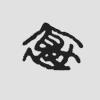襡
